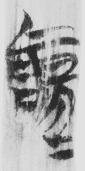瘍=
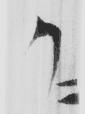人=
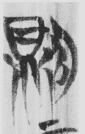則
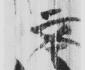不
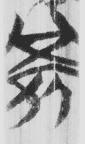{网乂刀}
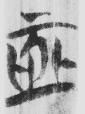亟
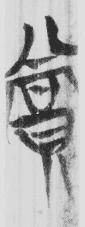賞
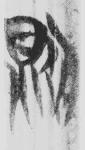則
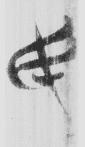民
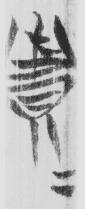賈=
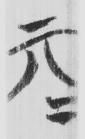亓=
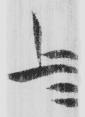上=
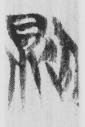則
